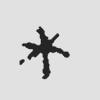木
